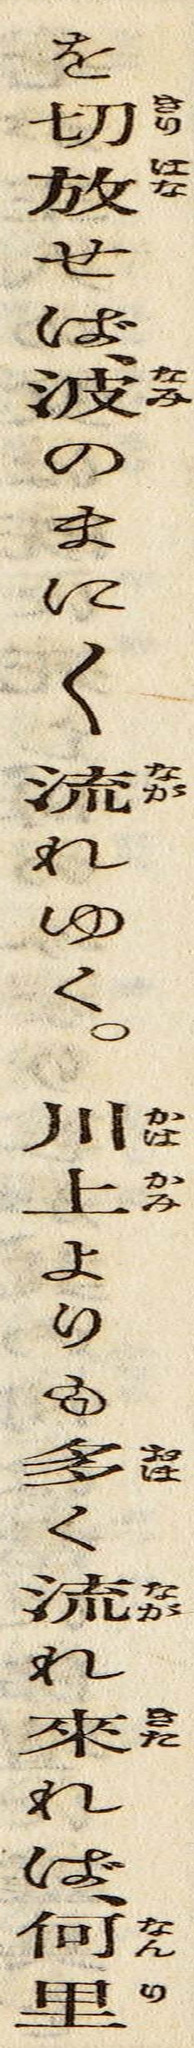を切放せば、波のまに〳〵流れゆく。川上よりも多く流れ来れば、何里
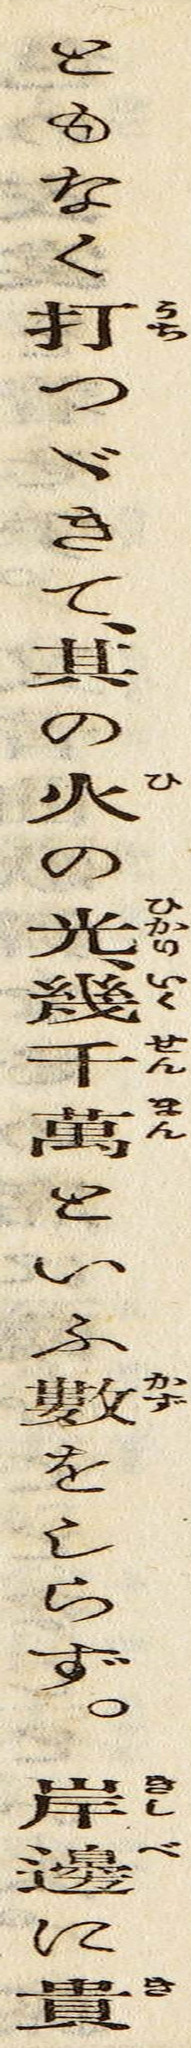ともなく打つヾきて、其の火の光、幾千万といふ数をしらず。岸辺に貴
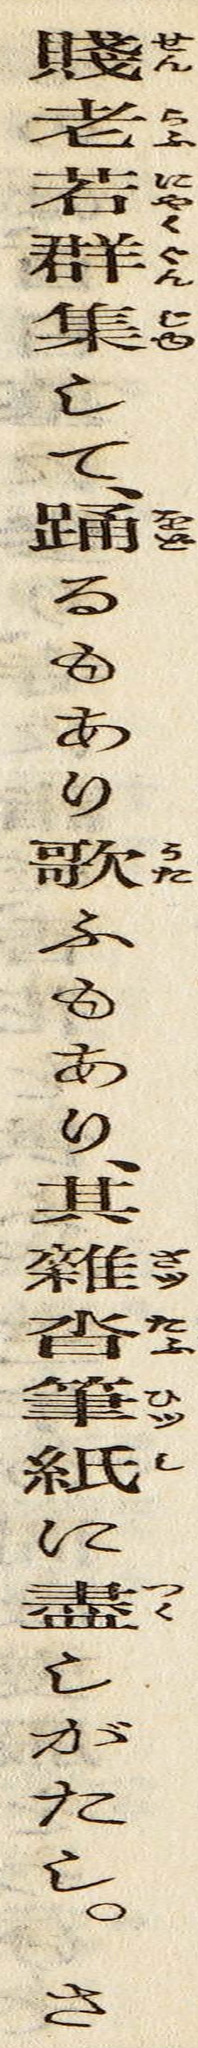賤老若群集して、踊るもあり歌ふもあり、其雑沓筆紙に尽しがたし。さ
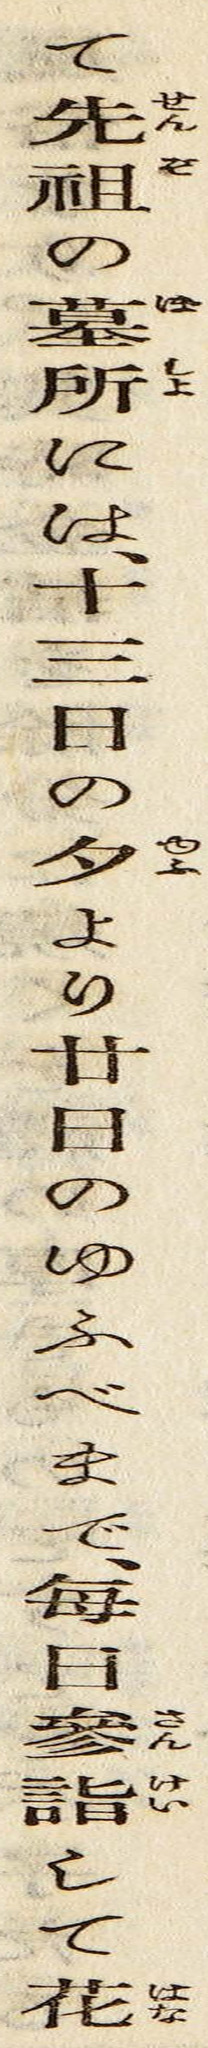て先祖の墓所には、十三日の夕より廿日のゆふべまで、毎日参詣して花
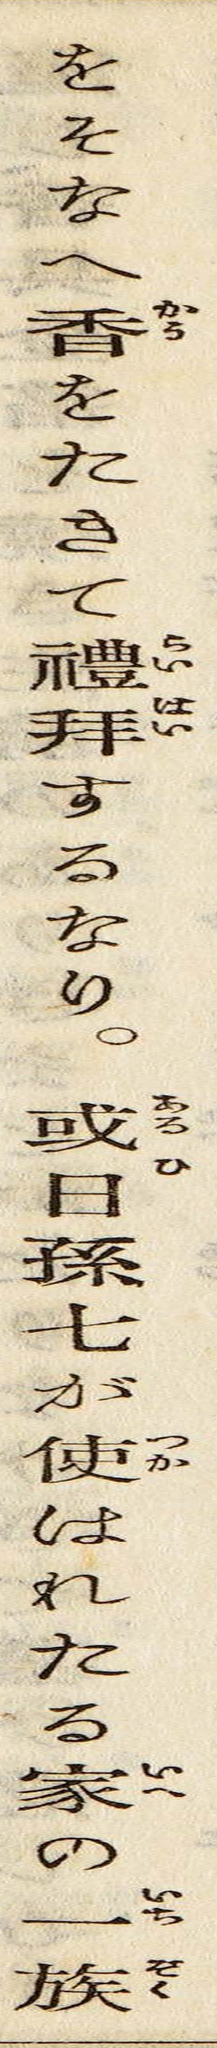をそなへ香をたきて礼拝するなり。或日孫七が使はれたる家の一族
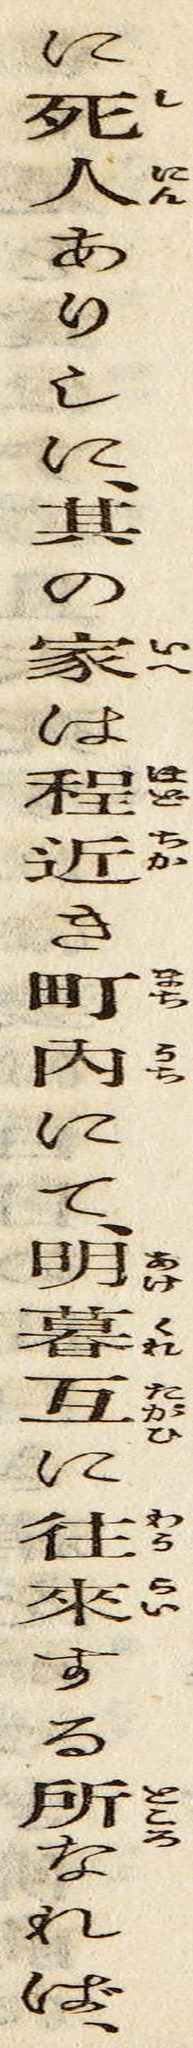に死人ありしに、其の家は程近き町内にて、明暮互に往来する所なれば、
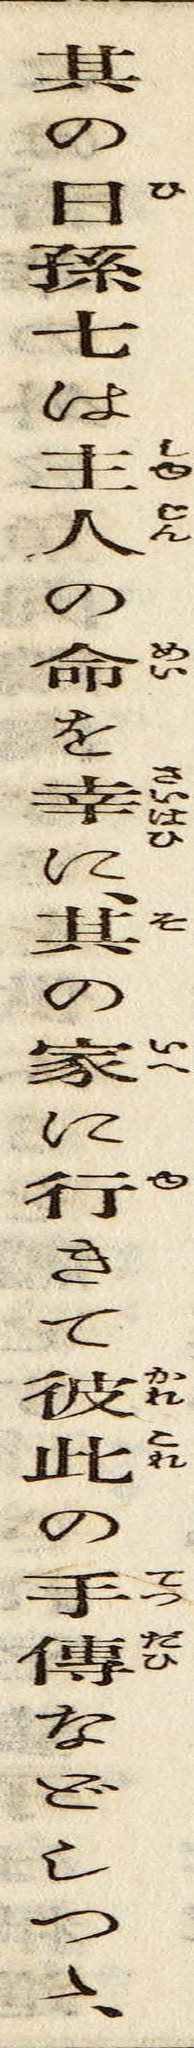其の日孫七は主人の命を幸に、其の家に行きて彼此の手伝などしつゝ、
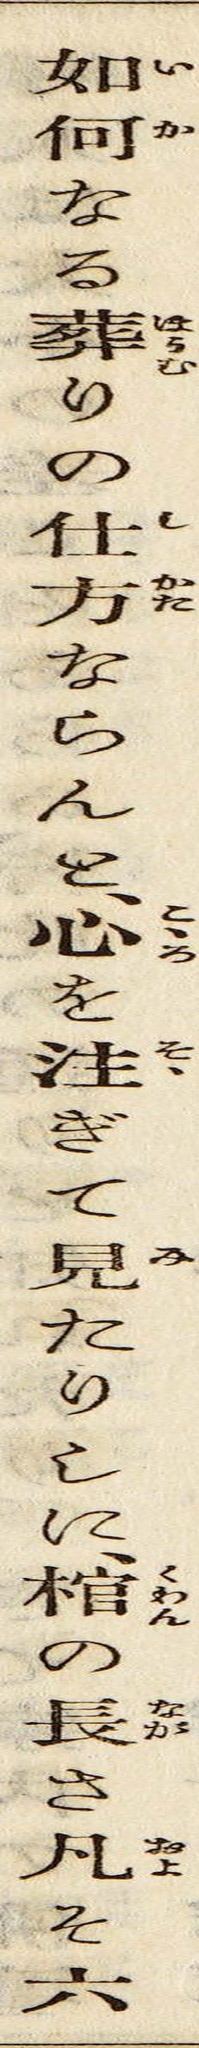如何なる葬りの仕方ならんと、心を注ぎて見たりしに、棺の長さ凡そ六
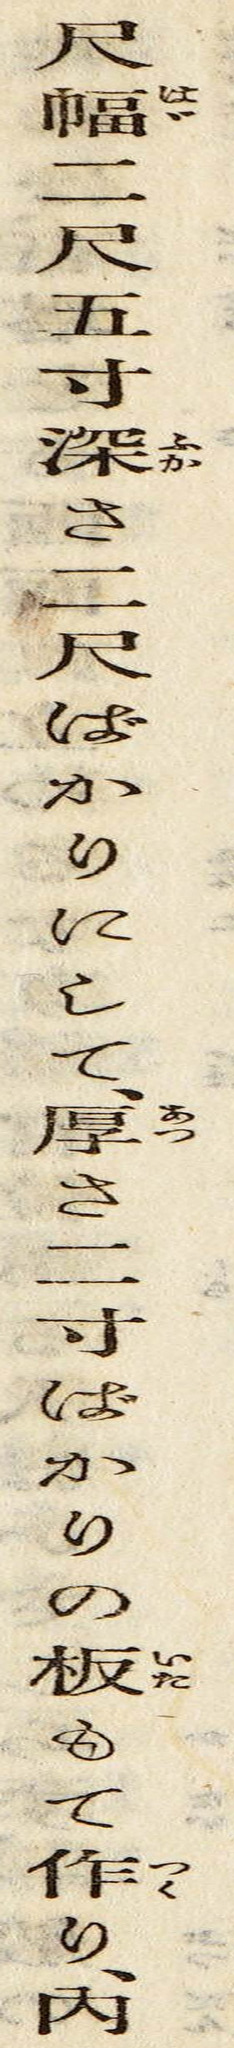尺幅二尺五寸深さ二尺ばかりにして、厚さ二寸ばかりの板もて作り、内
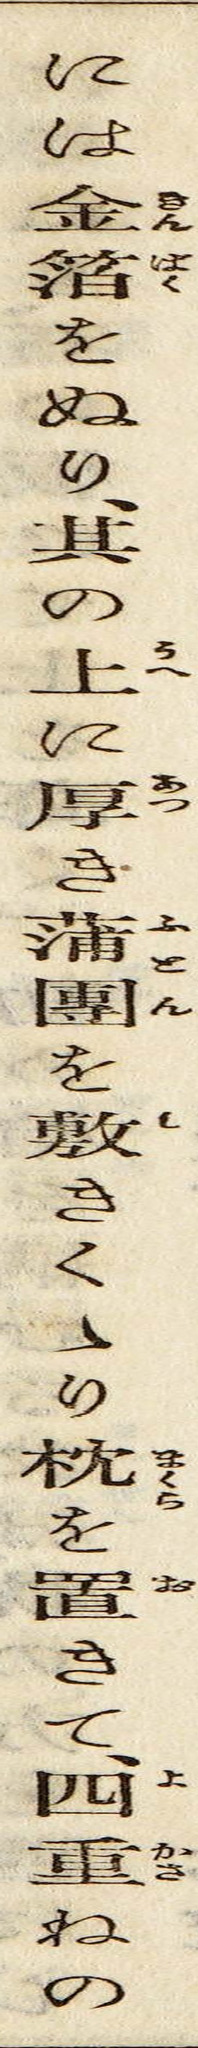には金箔をぬり、其の上に厚き蒲団を敷きくゝり枕を置きて、四重ねの
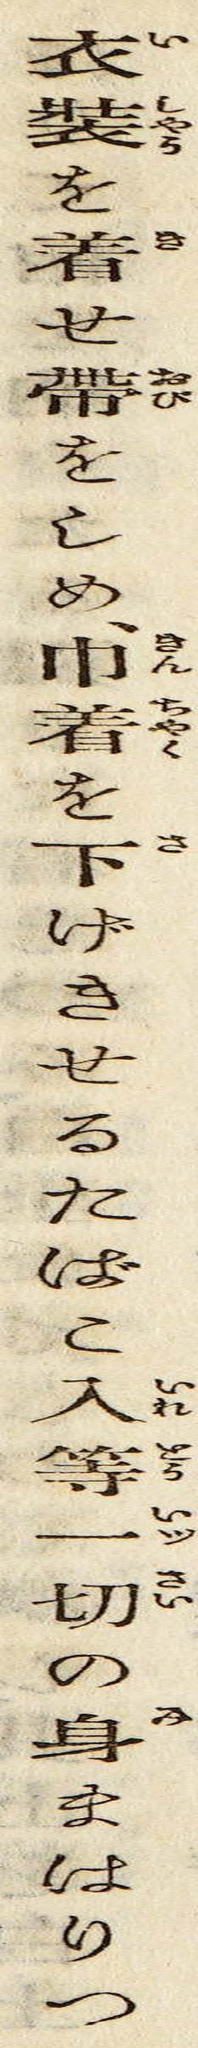衣装を着せ帯をしめ、巾着を下げきせるたばこ入等一切の身まはりつ
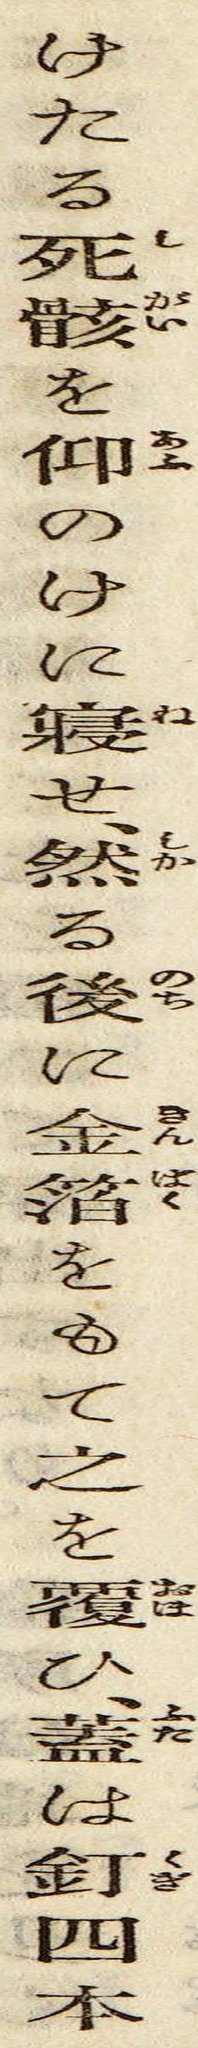けたる死骸を仰のけに寝せ、然る後に金箔をもて之を覆ひ、蓋は釘四本

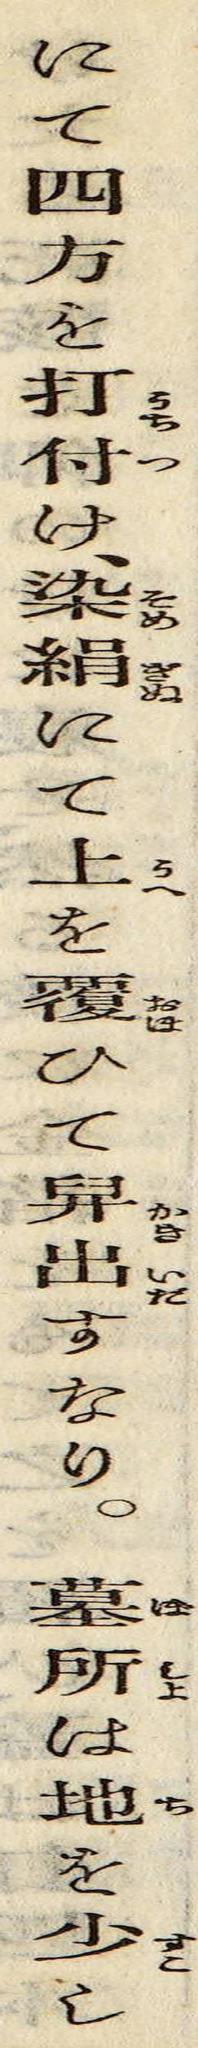にて四方を打付け、染絹にて上を覆ひて舁出すなり。墓所は地を少し
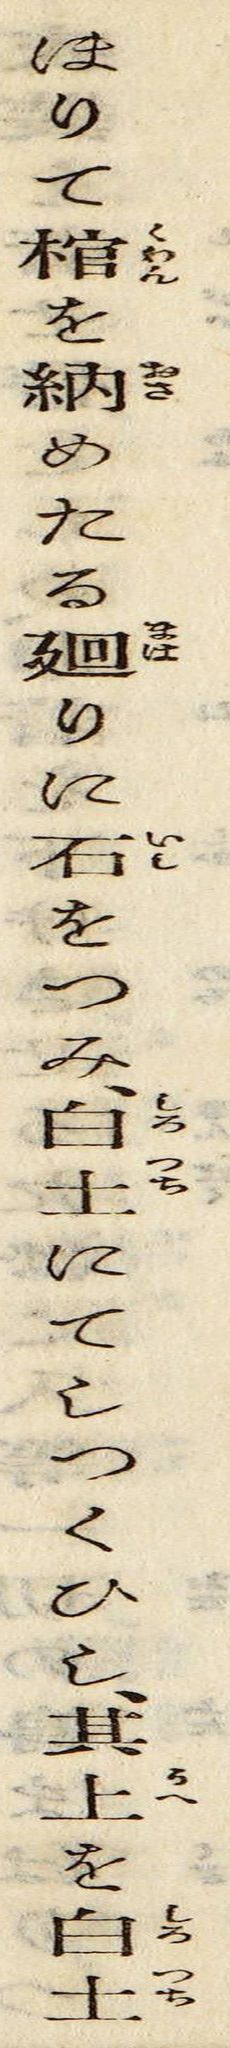ほりて棺を納めたる廻りに石をつみ、白土にてしつくひし、其上を白土
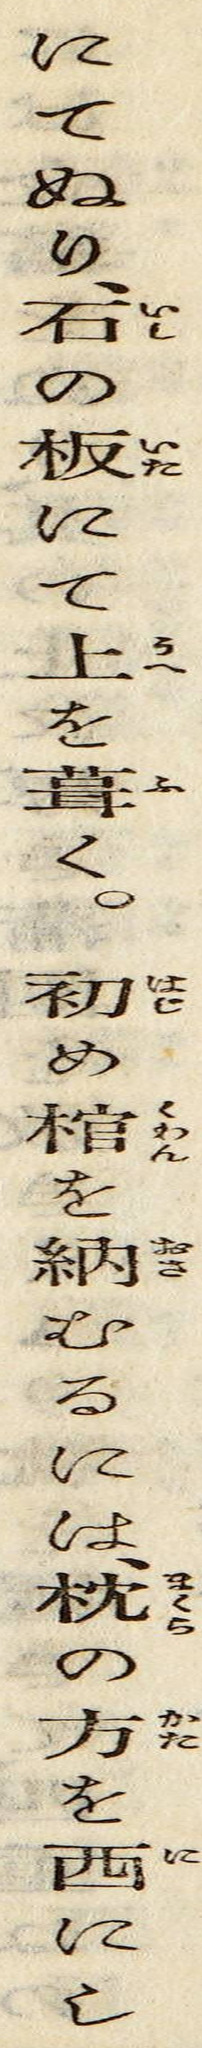にてぬり、石の板にて上を葺く。初め棺を納むるには、枕の方を西ににし
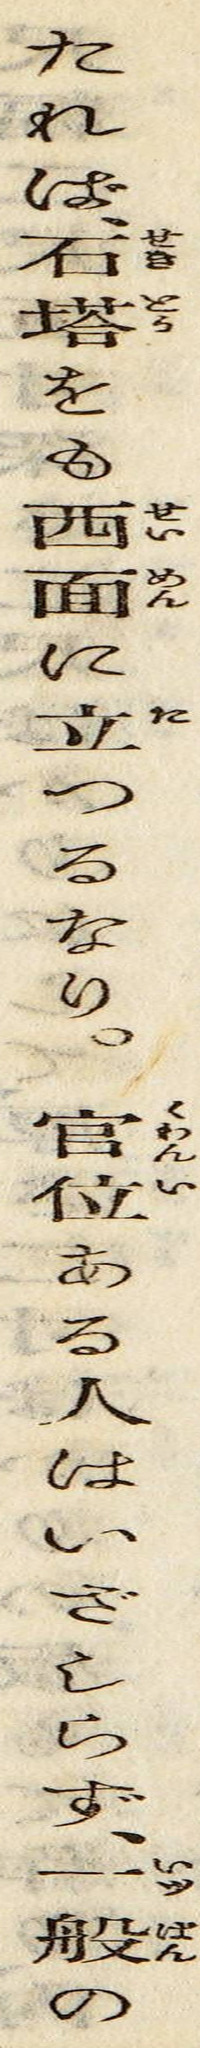たれば、石塔をも西面に立つるなり。官位ある人はいざしらず、一般の
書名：日本漂流譚
